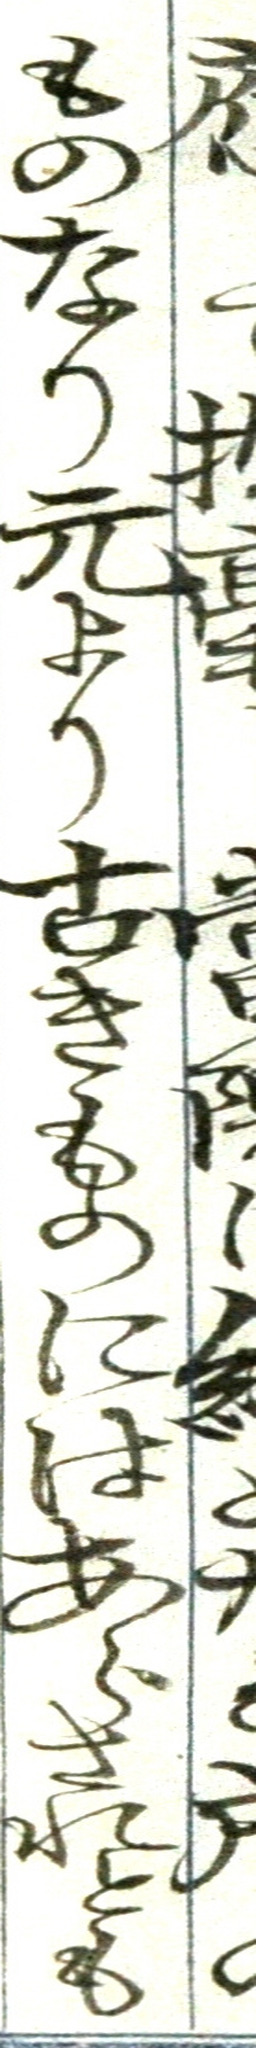ものなり元より古きものにはあらされとも

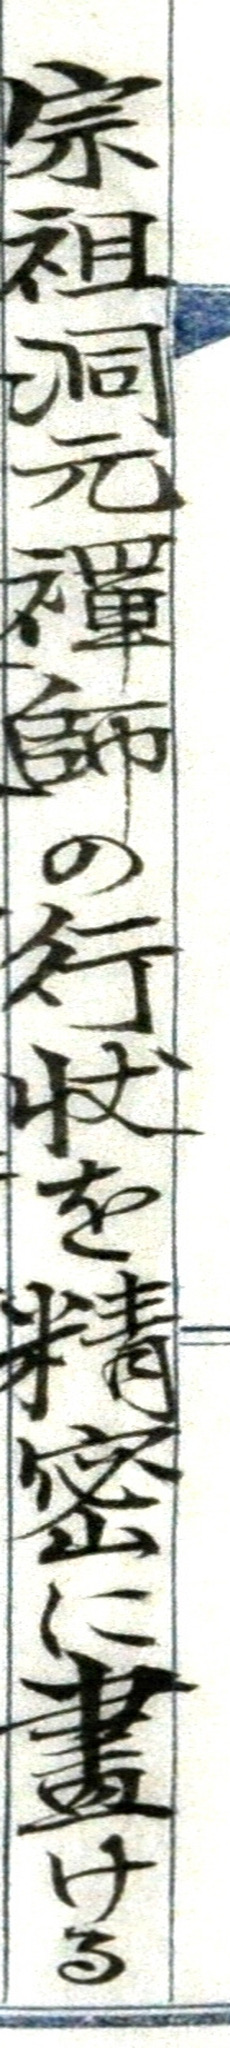宗祖洞元禅師の行状を精密に画ける
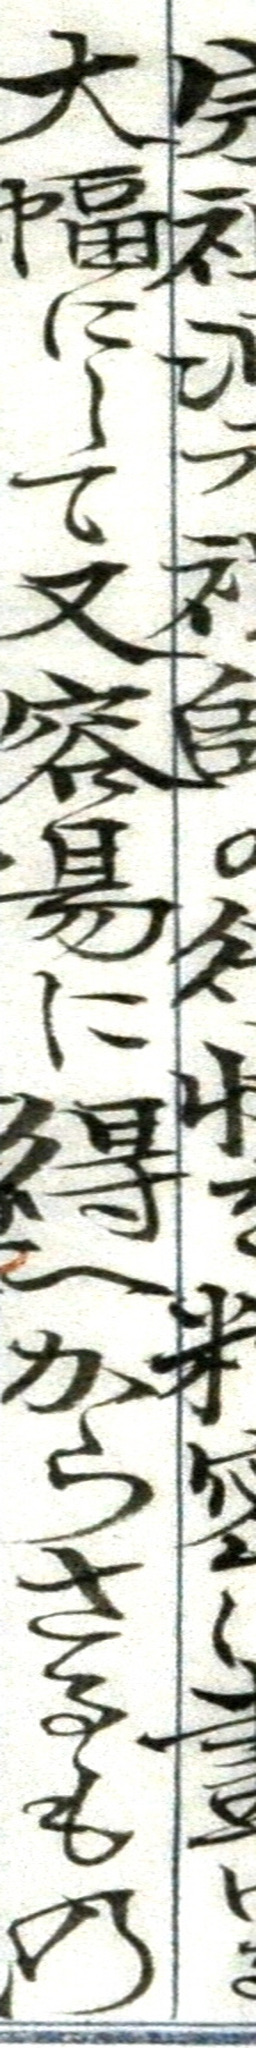大幅にして又容易に得へからさるもの
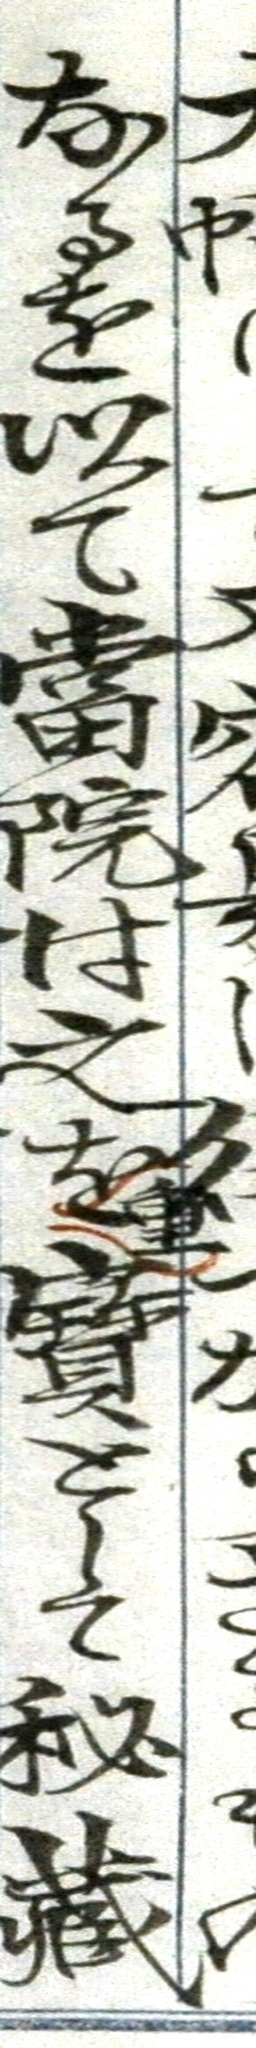なるを以て当院は之を重宝として秘蔵
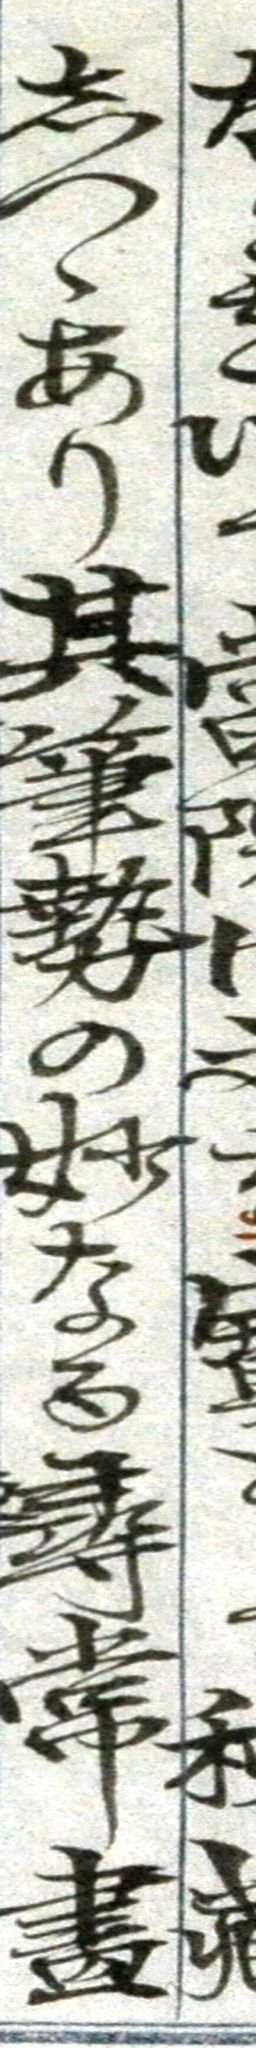しつゝあり其筆勢の妙なる尋常画
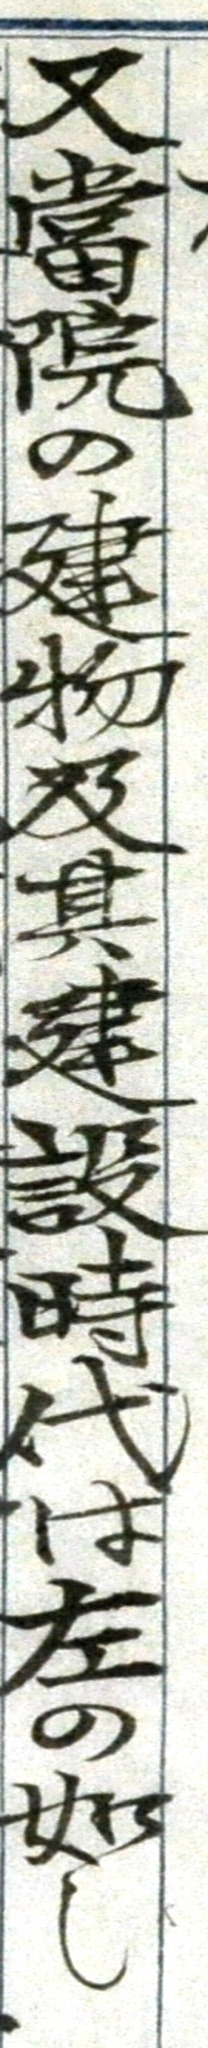又当院の建物及其建設時代は左の如し
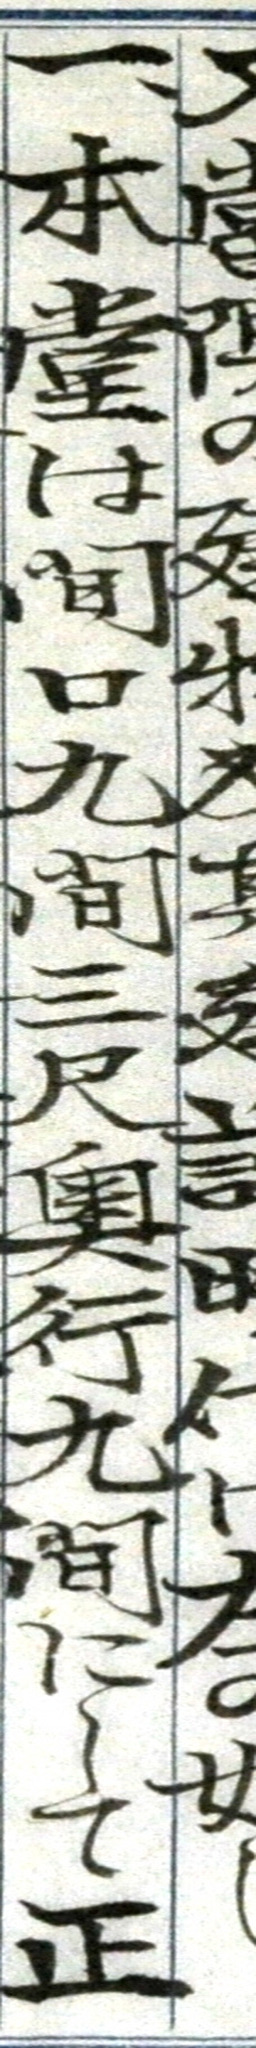一、本堂は間口九間三尺奥行九間にして正
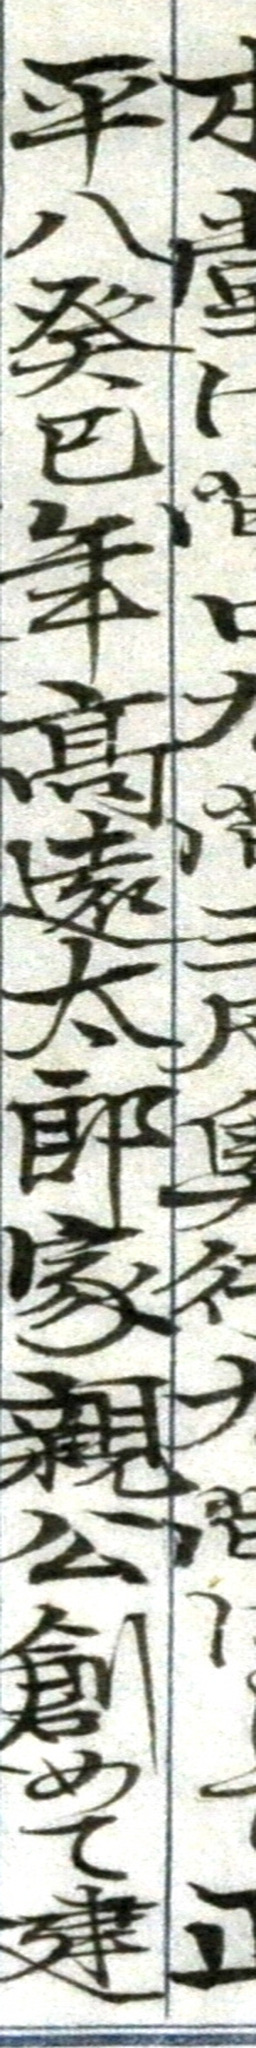平八年癸巳年高遠太郎家親公創めて建
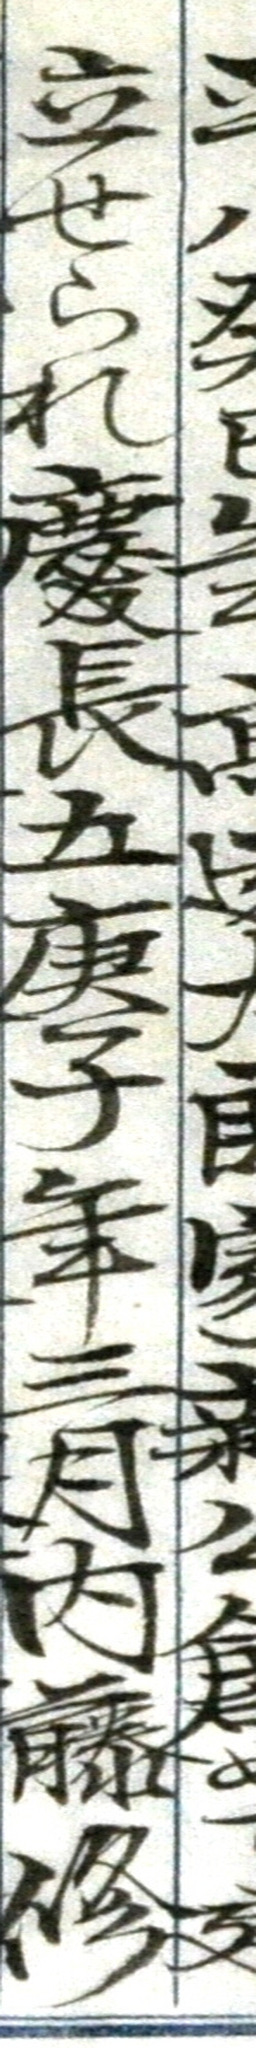立せられ慶長五庚年三月内藤修
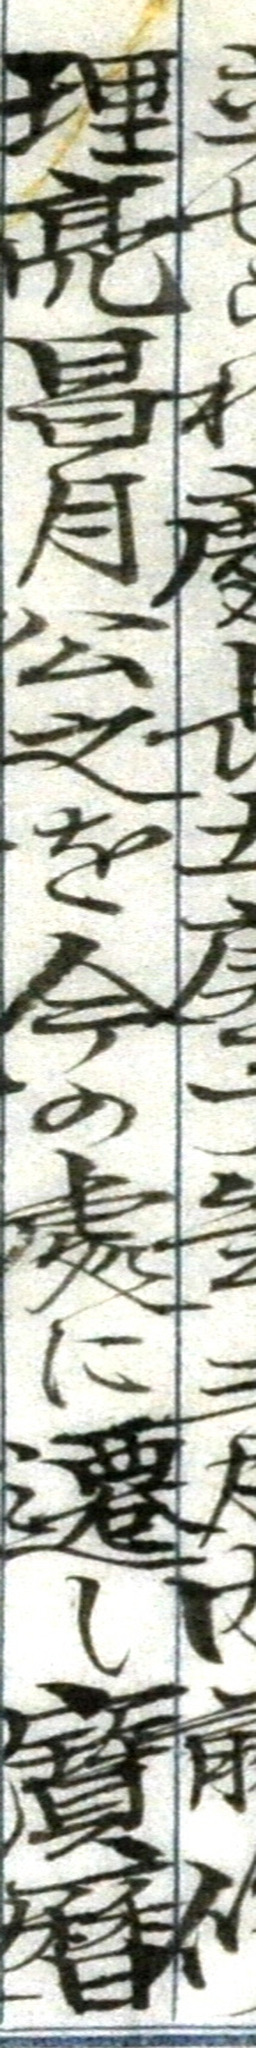理亮昌月公之を今の処に遷し宝暦
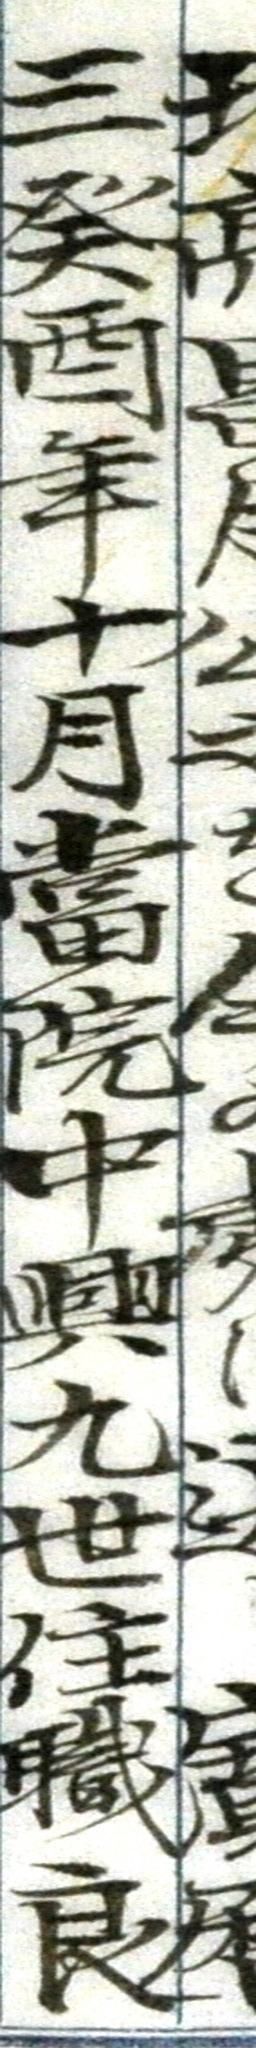三癸酉年十月当院中興九世住職良
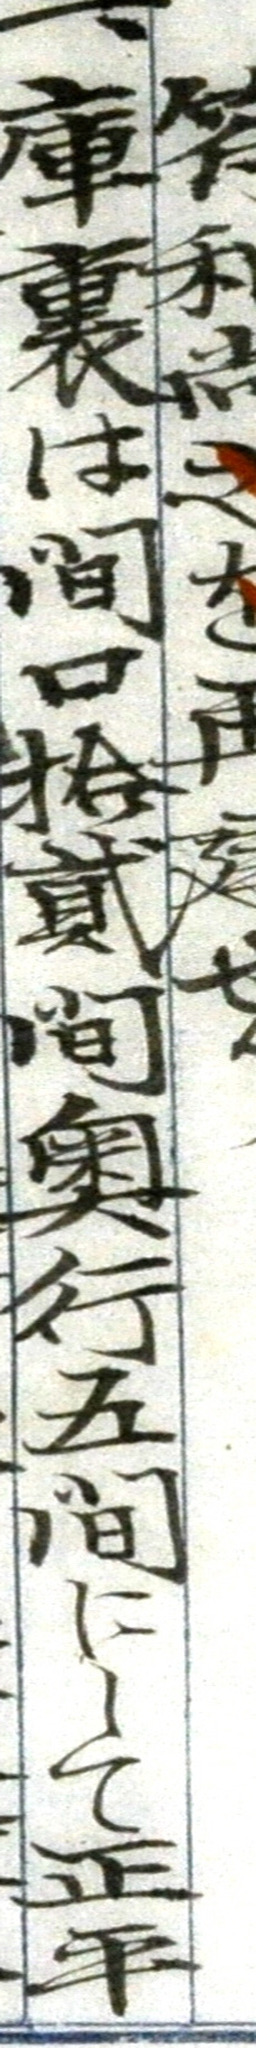二、庫裏は間口拾弐間奥行五間にして正平
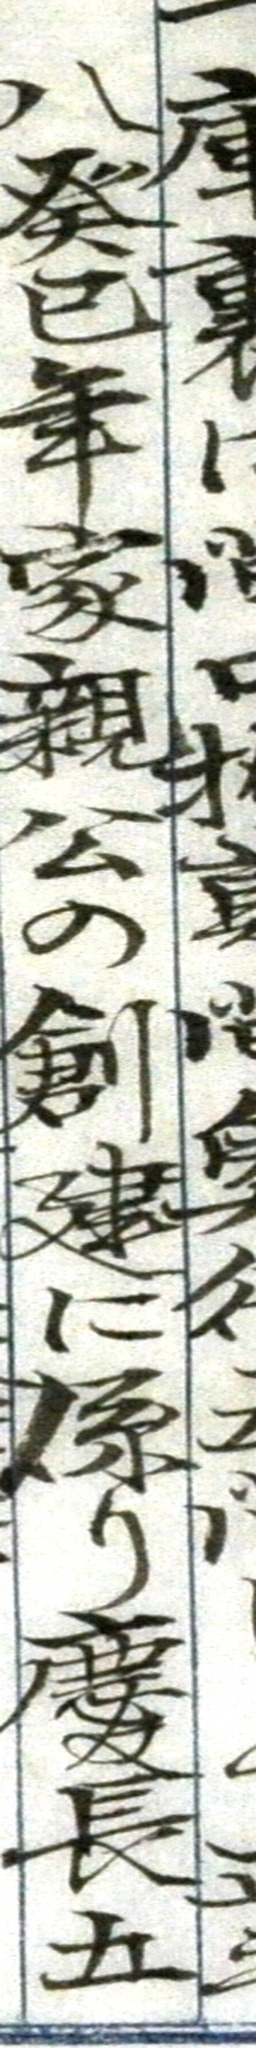八癸巳年家親公の創建に係り慶長五
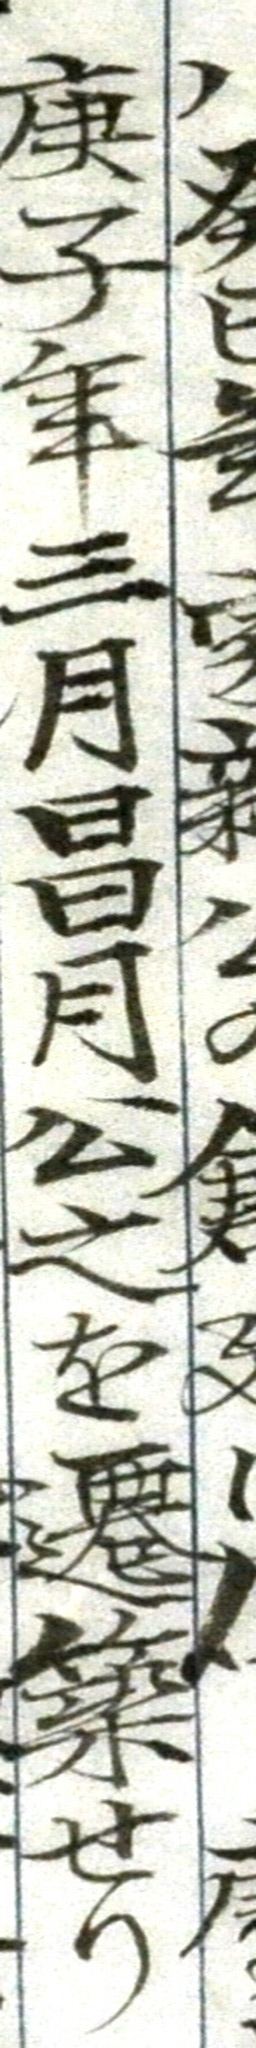庚子年三月昌月公之を遷築せり
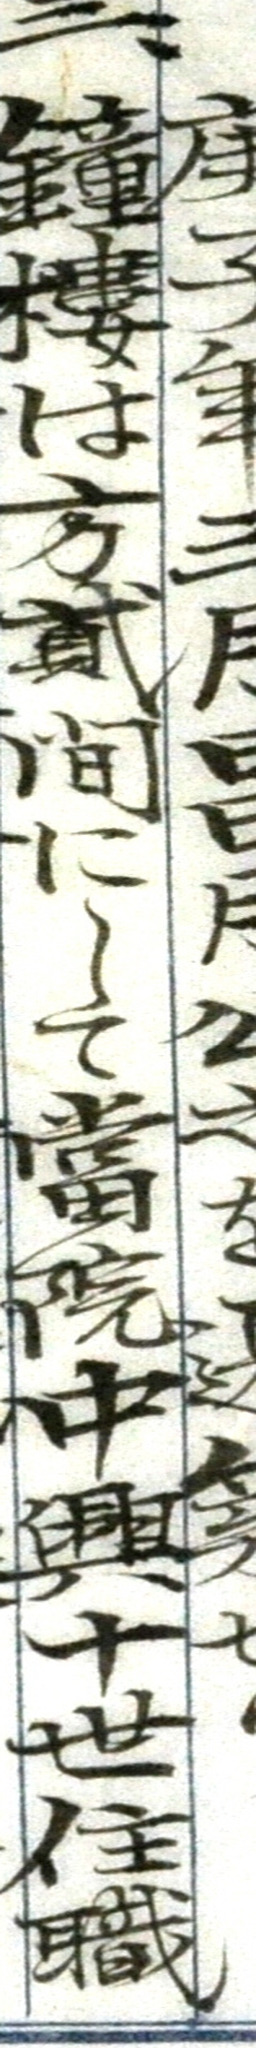三、鐘楼は方弐間にして当院中興十世住職
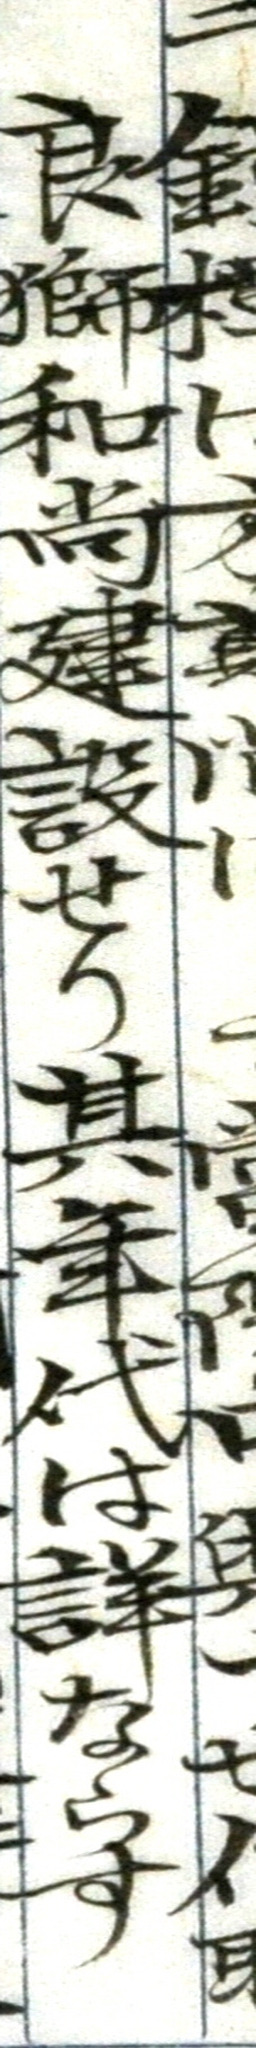良獅和尚建設せり其年代は詳ならす
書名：桂泉院・樹林寺・東光寺縁起書、蓮華寺由来書、付夕顔観音記
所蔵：伊那市立高遠町図書館・合同会社AMANE
